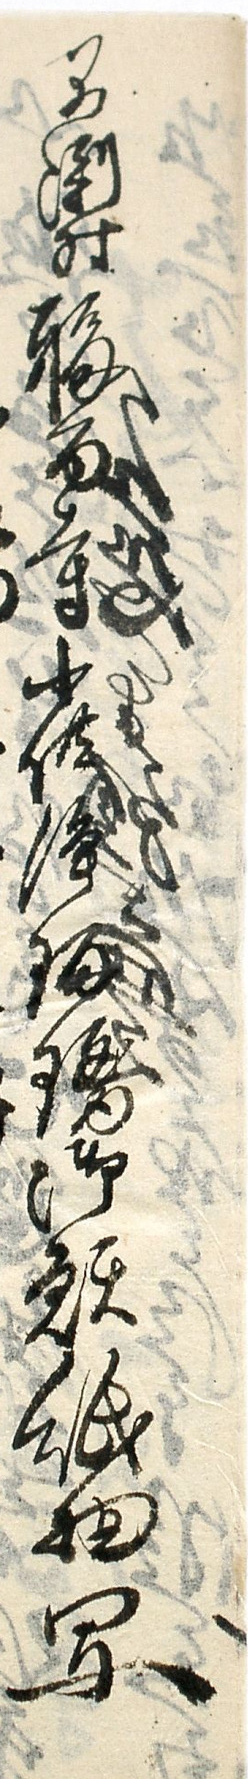早渕村福満寺小供浄瑠璃御願紙面写
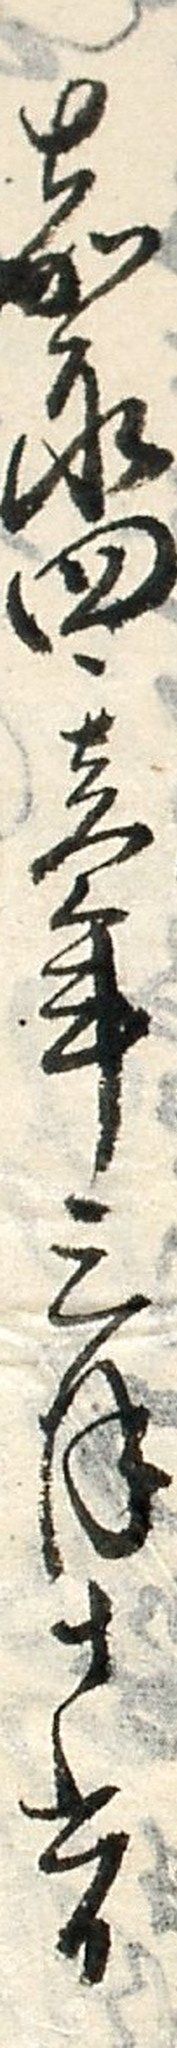嘉永四亥年三月十六日

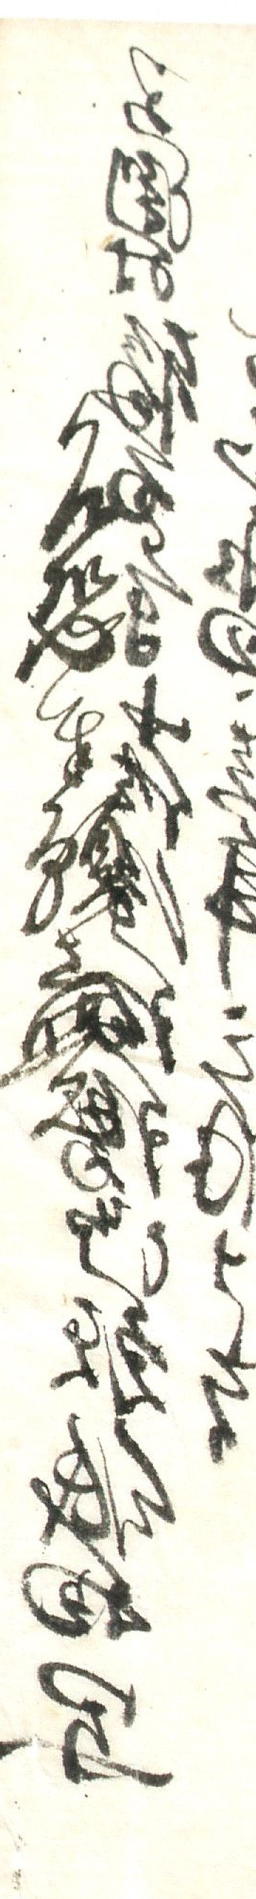乍恐奉願上覚
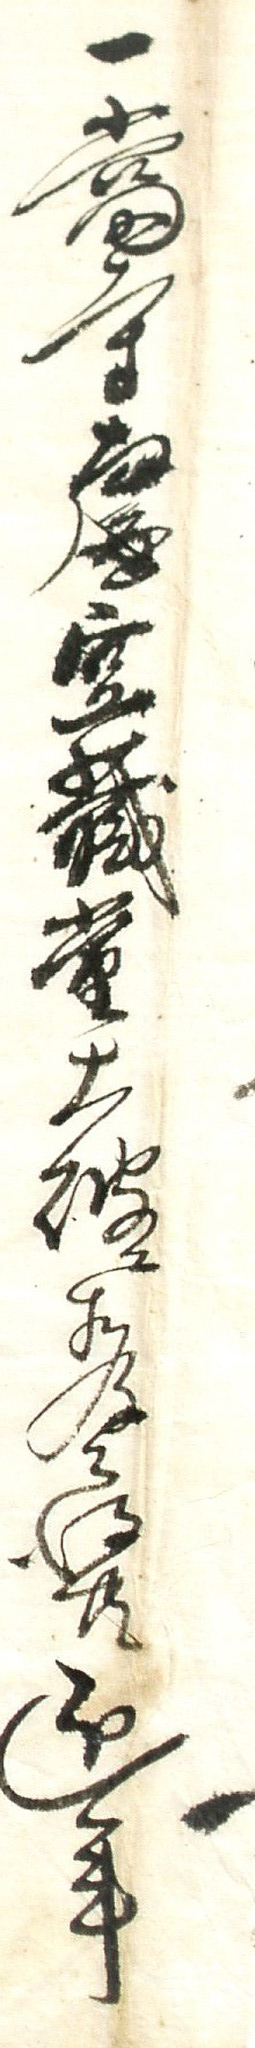一當寺虚空蔵堂大破ニ相及候得共近年
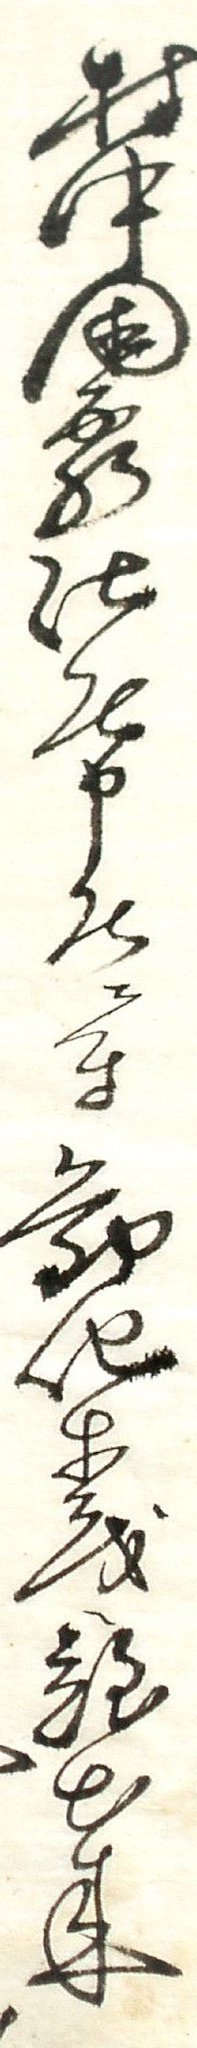村中困窮仕居申居ニ付勧化等も難出来
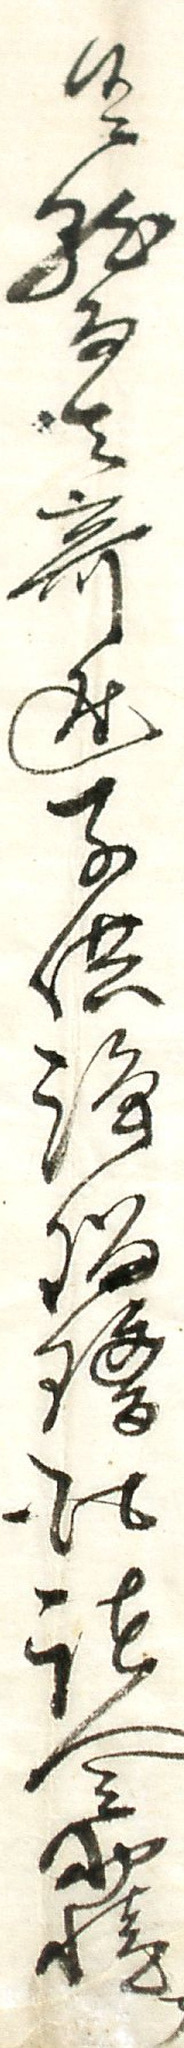候ニ就而者奇進子供浄瑠璃仕諸人之助情ヲ
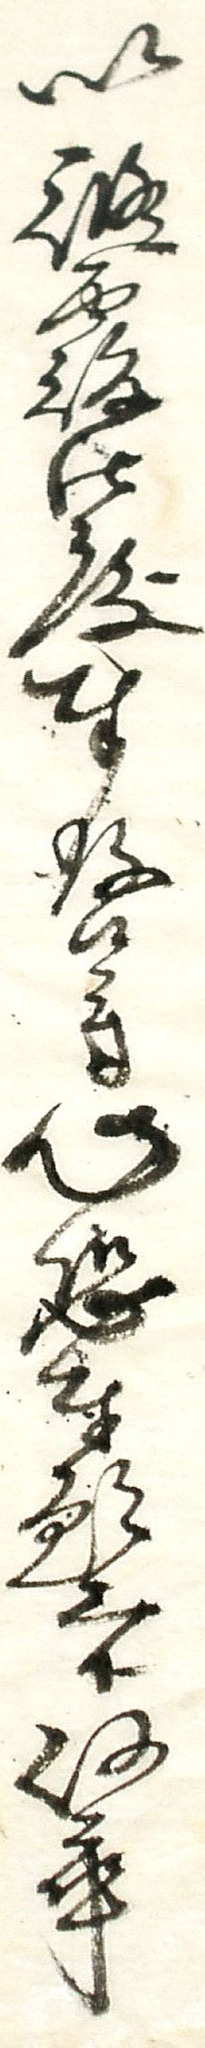以修覆仕度奉存候ニ付乍恐奉願上候何卒
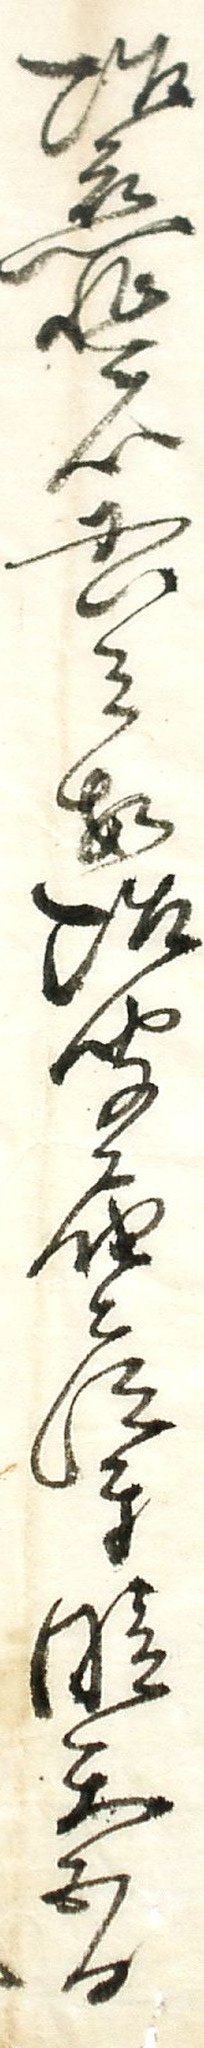御慈悲ヲ以右之段御聞届被仰付晴天五日
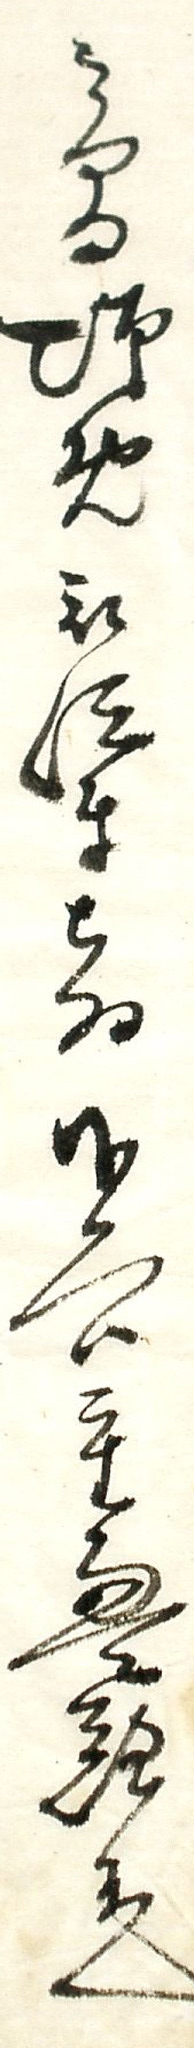之間御免被仰付被為下候ヘハ重畳難有
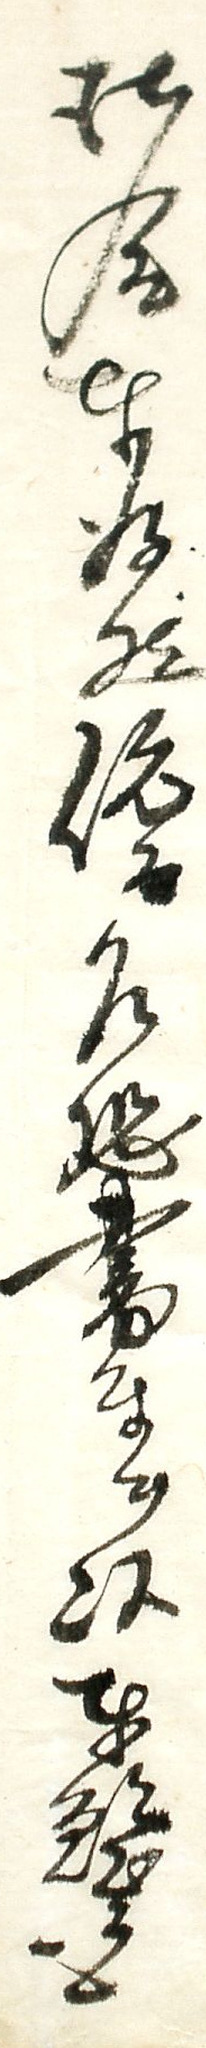仕合奉存候依而乍恐書付ヲ以奉願上候以上
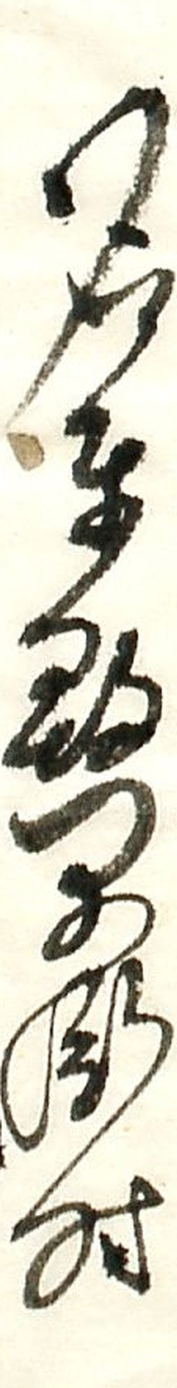名東郡早渕村
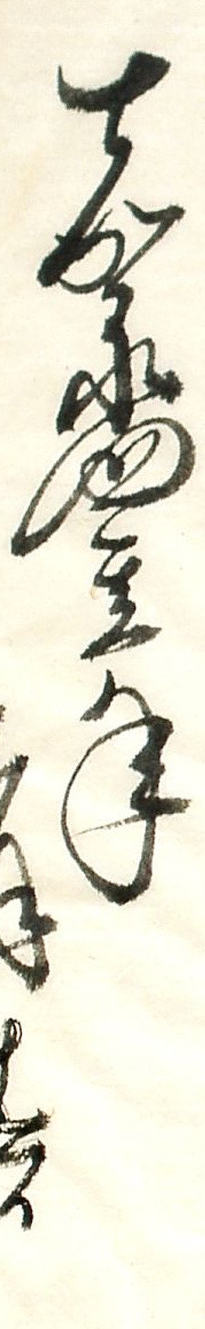嘉永四亥年福満寺
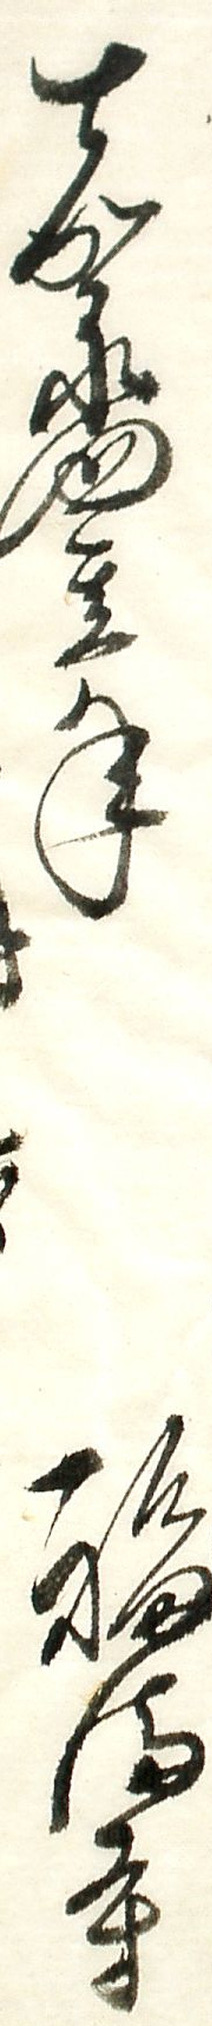嘉永四亥年福満寺
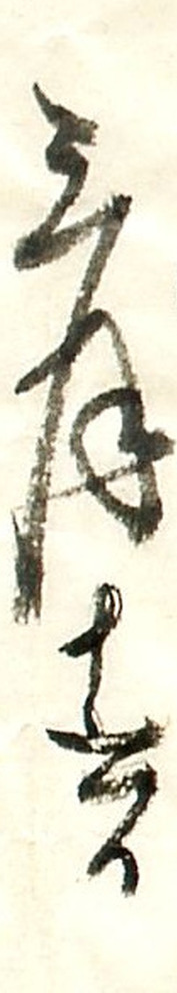三月十六日
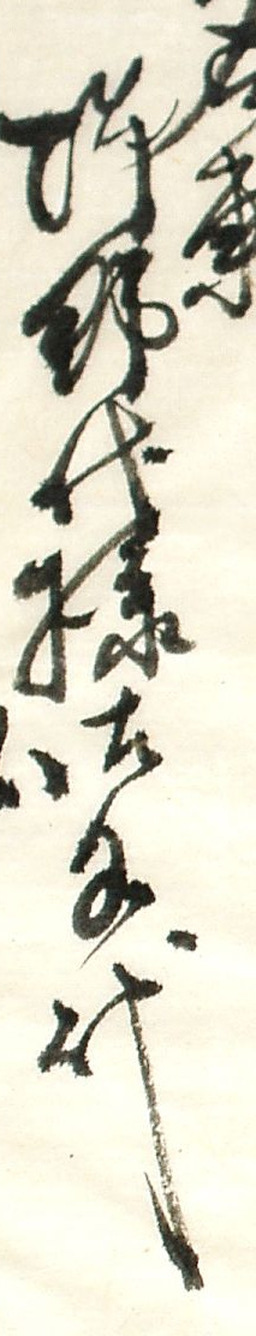御郡代様御手代
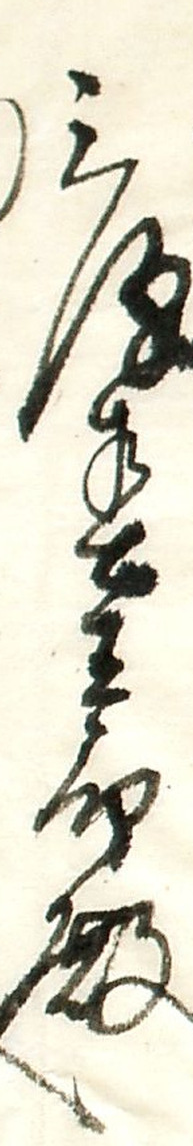三澤春太郎殿
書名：(早渕村福満寺子ども浄瑠璃願紙面）他
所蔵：鳴門教育大学 Naruto University of Education
